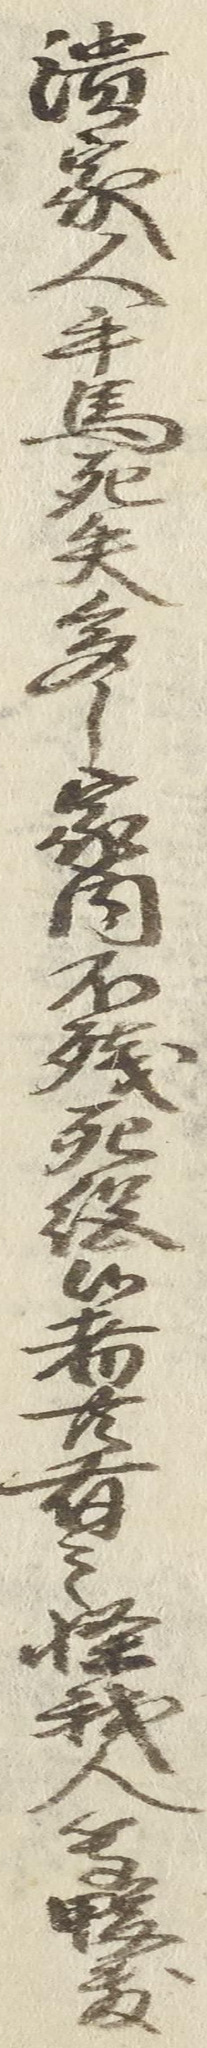潰家人牛馬死失多し家内不残死絶候者共有之怪我人等夥敷
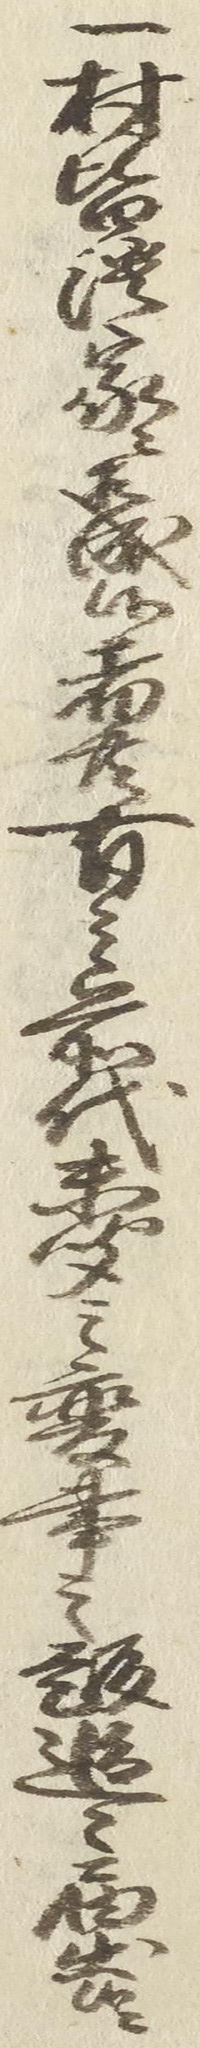一村皆潰家ニ相成候者共有之前代未聞之変事之趣追々届出候ニ
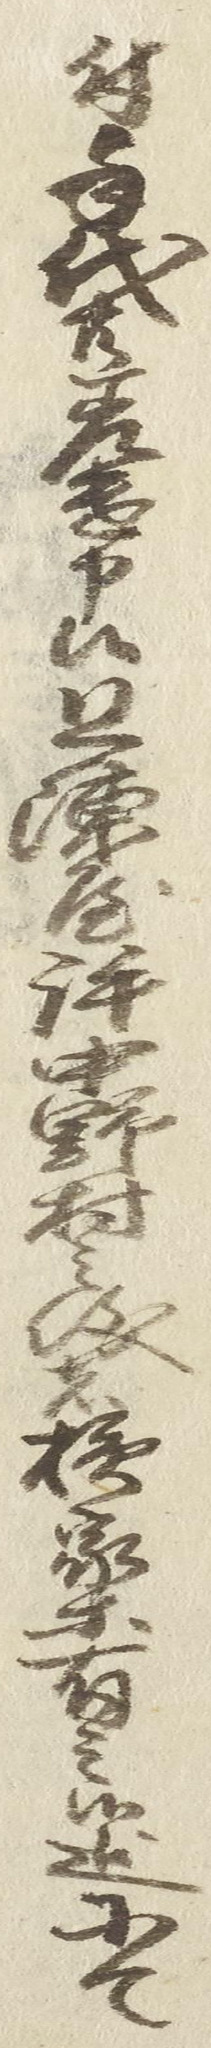付手代共差遣申候且陣屋許中野村之儀は潰家等有之候迄にて
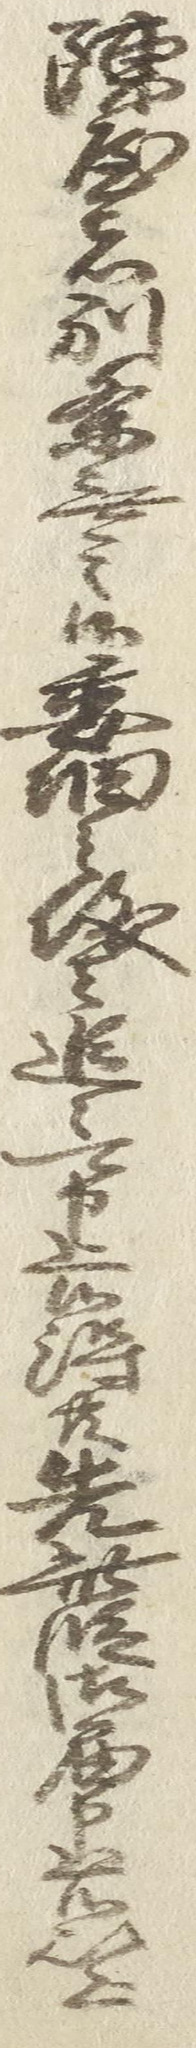陣屋は別条無之候委細之儀は追々可申上候得共先此段御届申上候以上
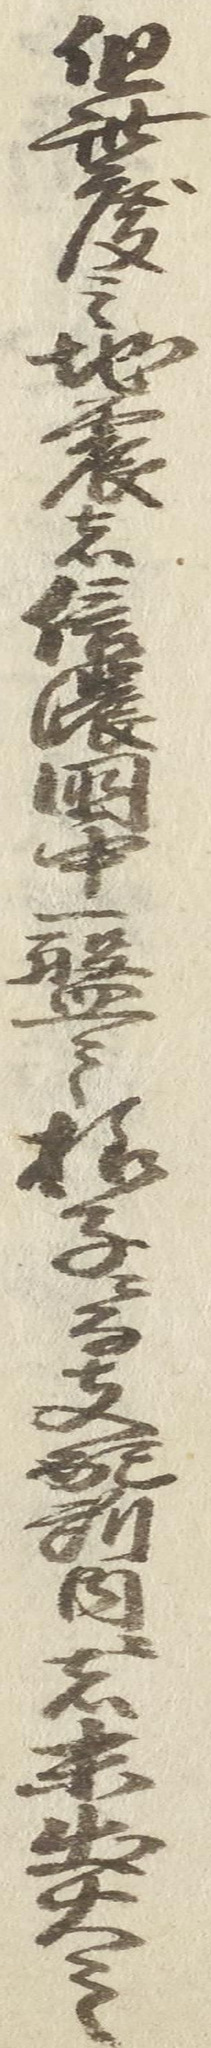但此度之地震は信濃国中一盤之様子ニ而支配所内ニは未出火之
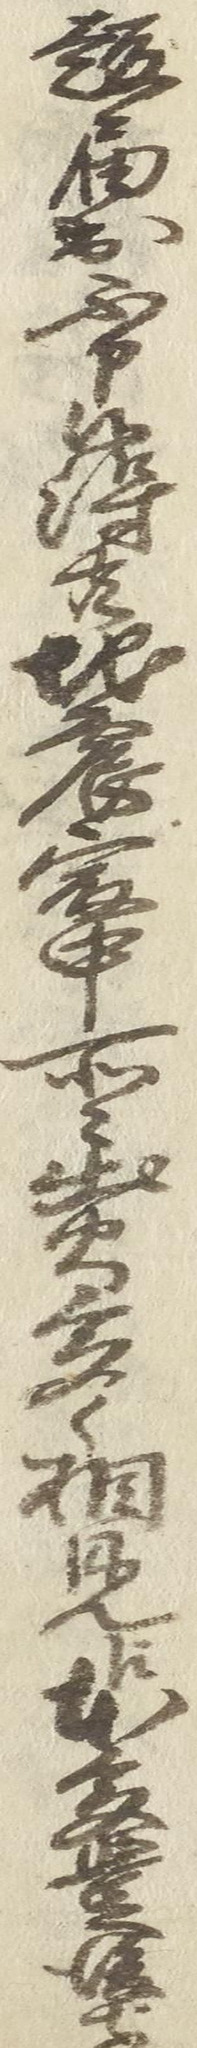趣届出不申候得共地震最中所々出火多く相見江本多豊後守

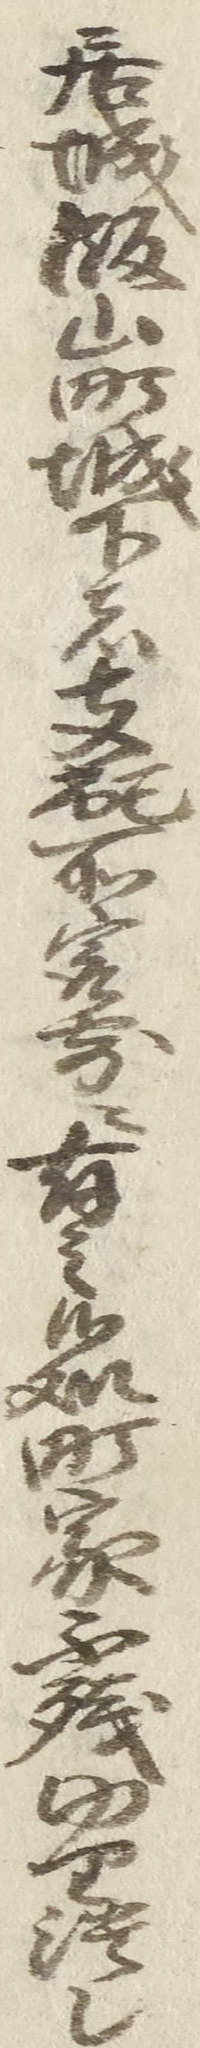居城飯山町城下は支配所最寄ニ有之候処町家不残ゆり潰し
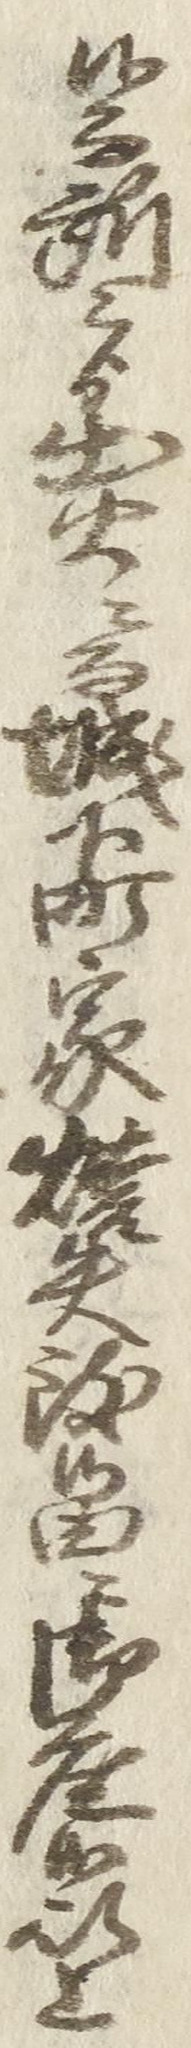候而所々ゟ出火ニ而城下町家焼失致候由ニ御座候以上
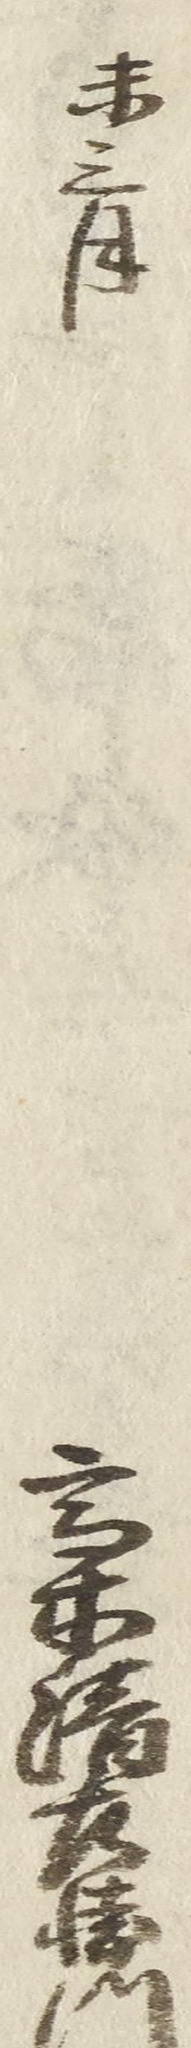未三月髙木清左衛門
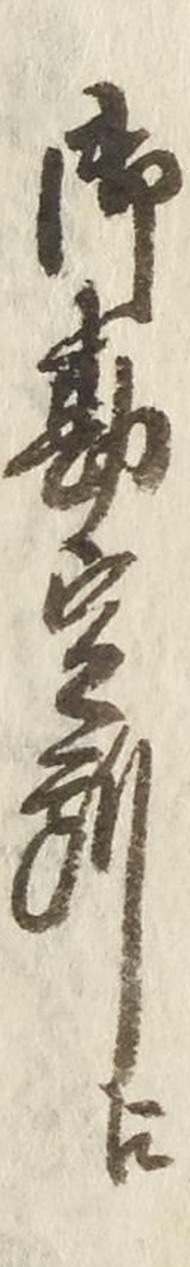御勘定所江
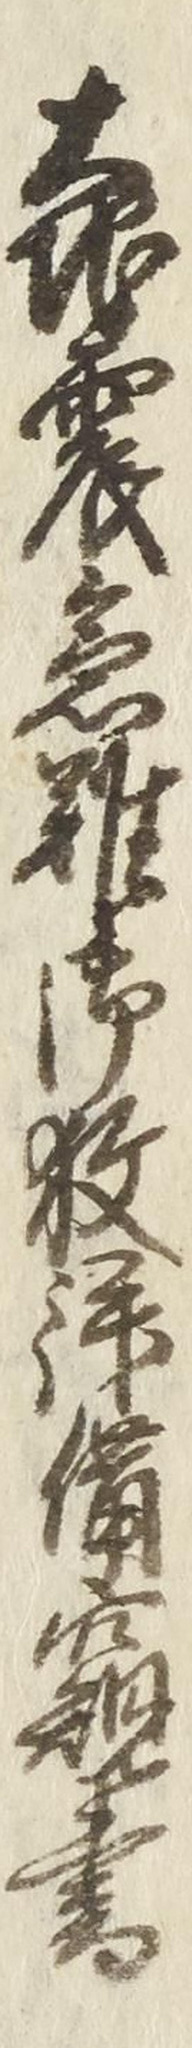大地震急難御救拝備窺書
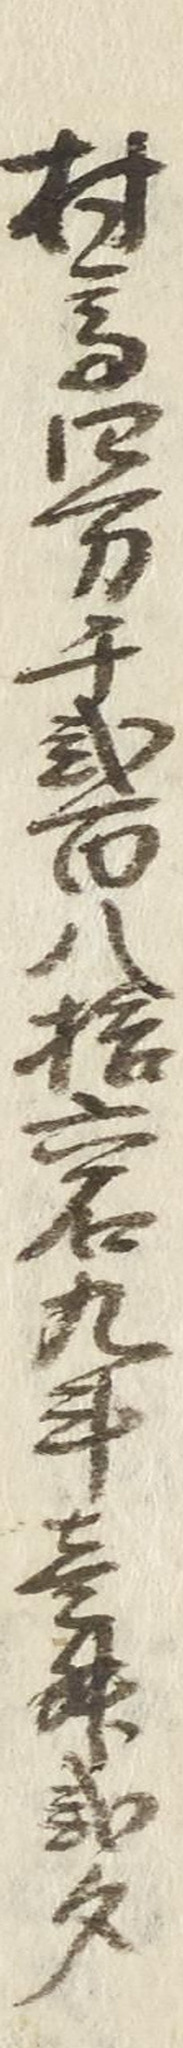一村高四万千弐百八拾六石九斗壱升弐勺
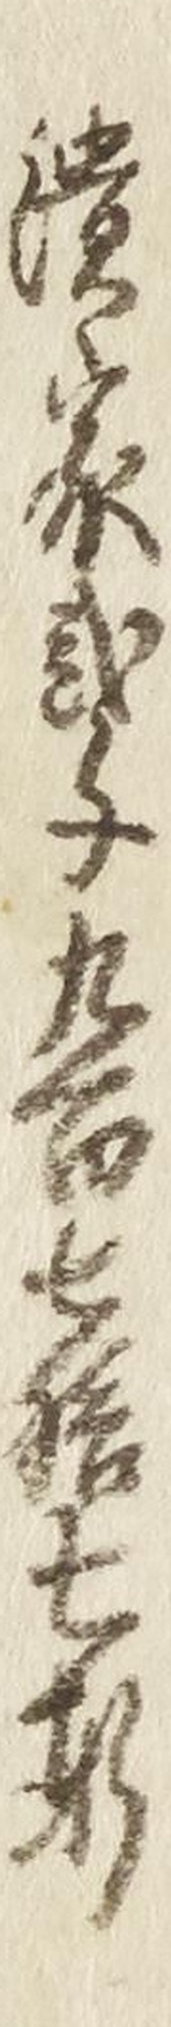潰家弐千九百七拾七軒
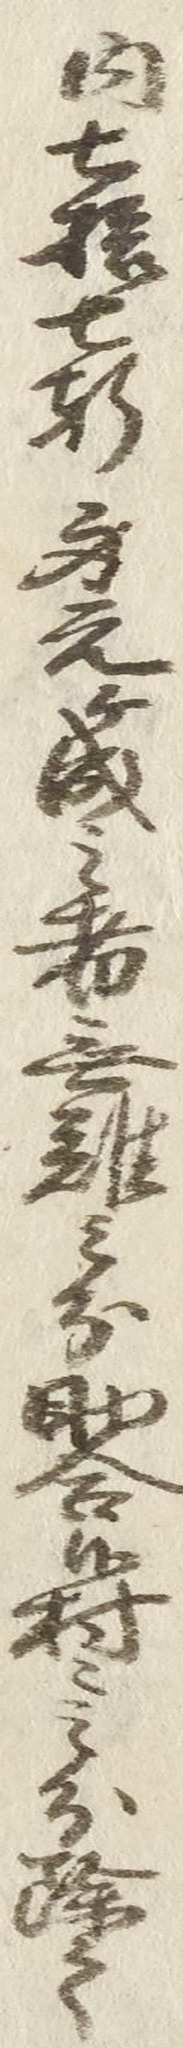内七拾七軒身元ヶ成之者無難分助合候村々之分除之
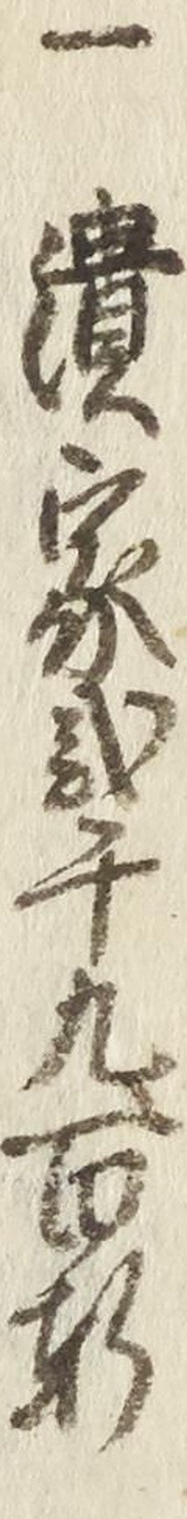一潰家弐千九百軒
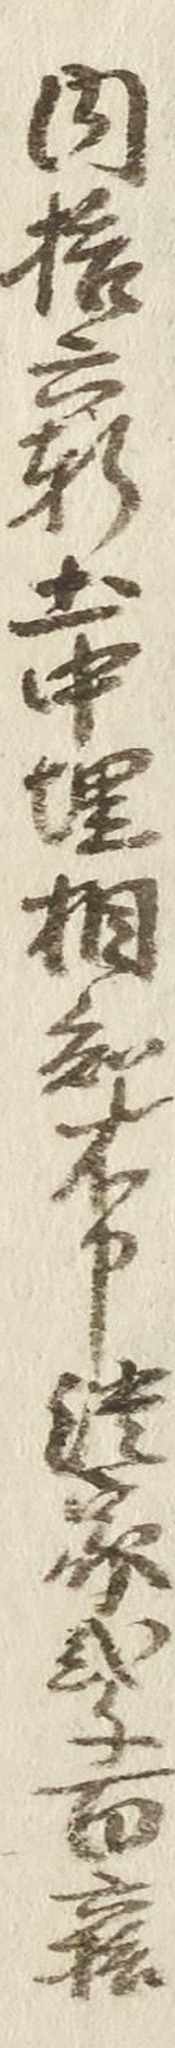内拾六軒土中埋相知不申潰家弐千百六拾
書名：従往古地震御届書記誌之一
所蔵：東京大学地震研究所図書室 Earthquake Research Institute Library, The University of Tokyo, JAPAN
